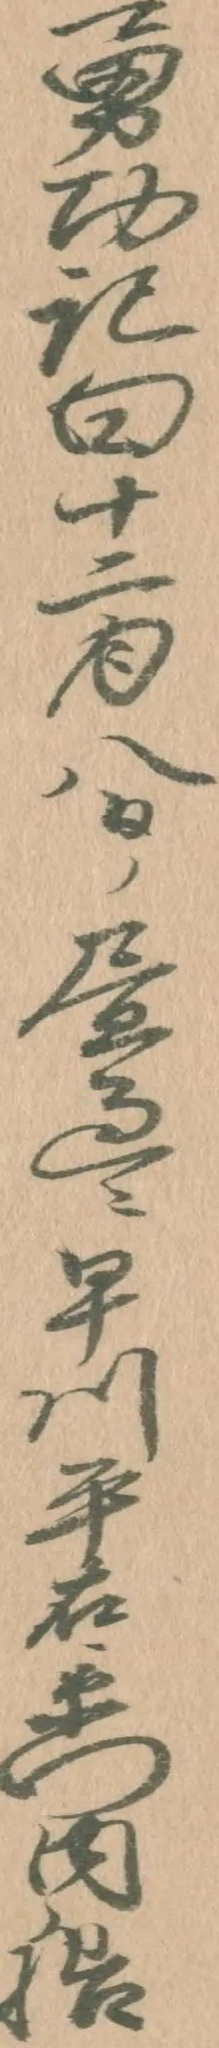勇功記曰十二月八日之昼過に早川平右衛門内膳
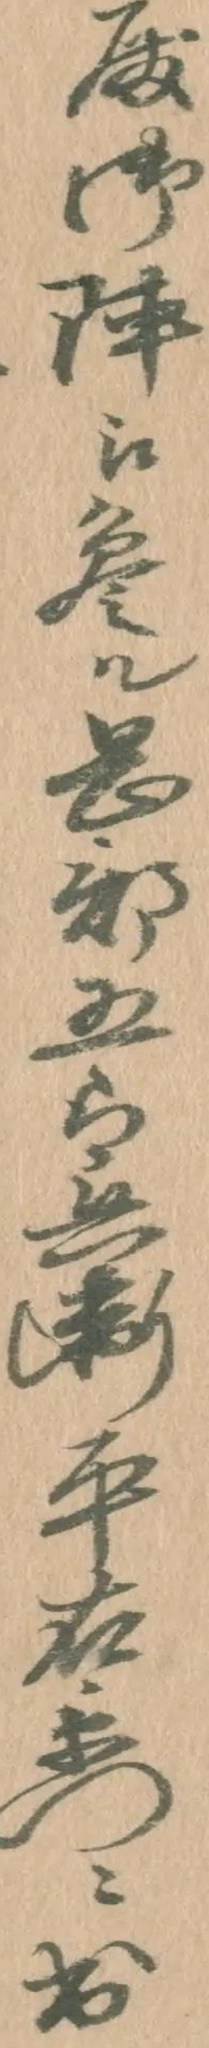殿恩陣江参る岡部五郎兵衛平右衛門に出
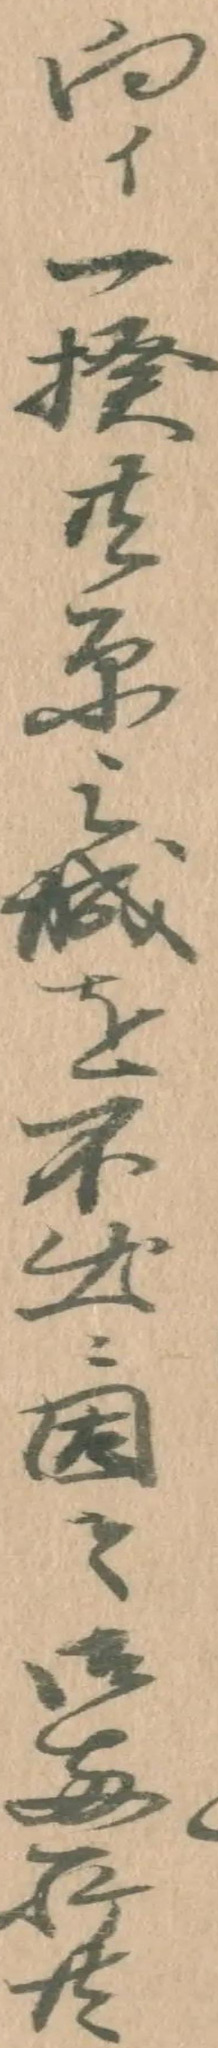向い一揆共原之城を不出に因て御両所共
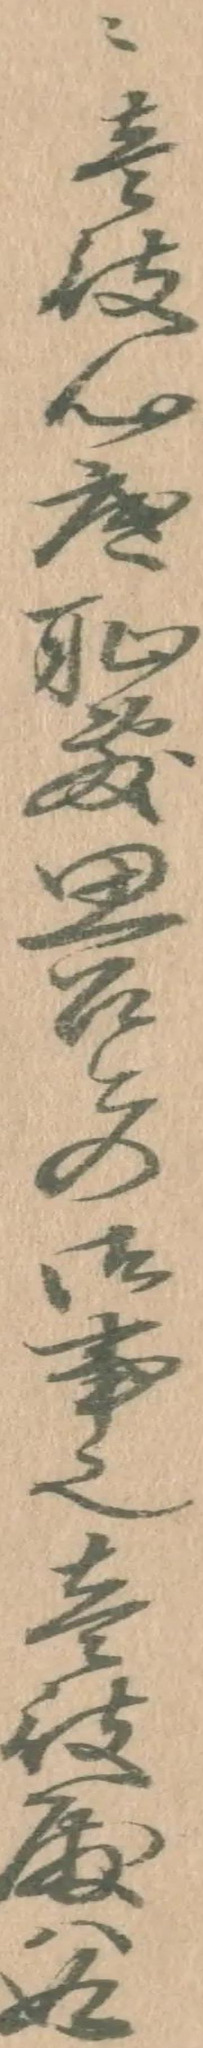に壱岐心底恥辱思召との御事也壱岐殿は如
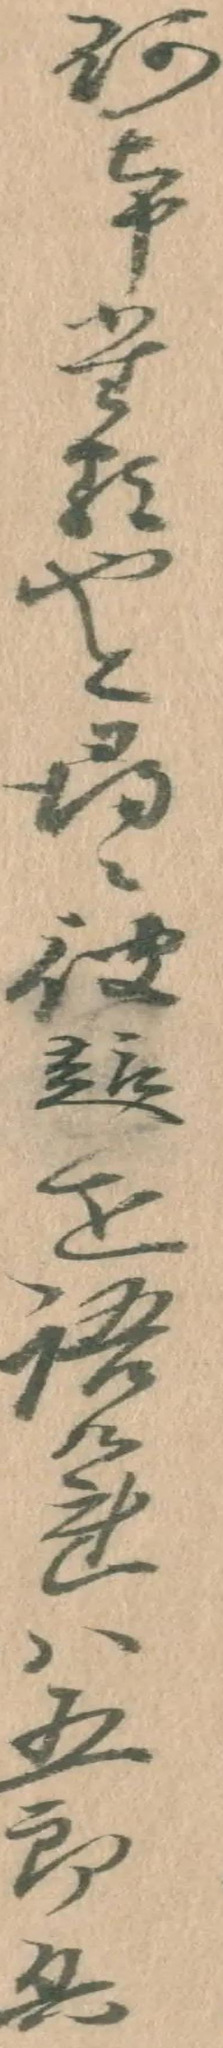何被申堂類やと尋に彼趣を語け連は五郎兵
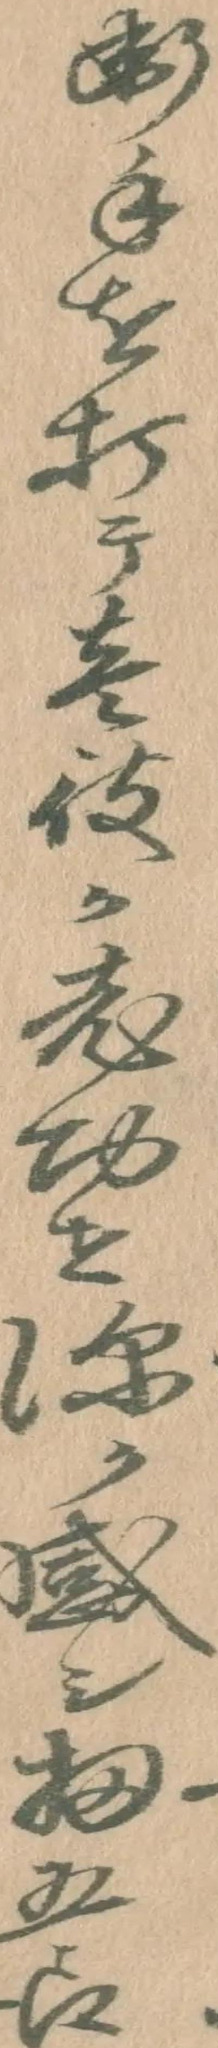衛手を打て壱岐か老功を深く感し扨五郎
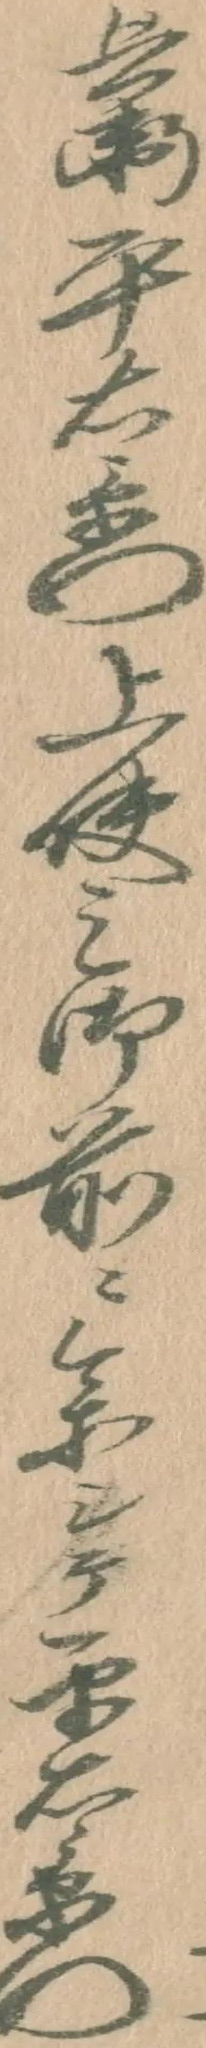兵衛平右衛門上使之御前に参して平右衛門
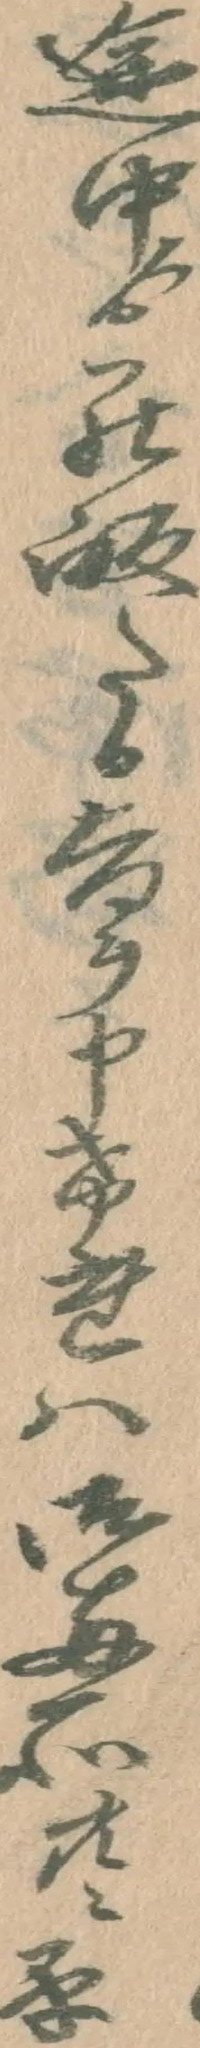途中ゟ罷皈たる旨を申希連は御両所共に平
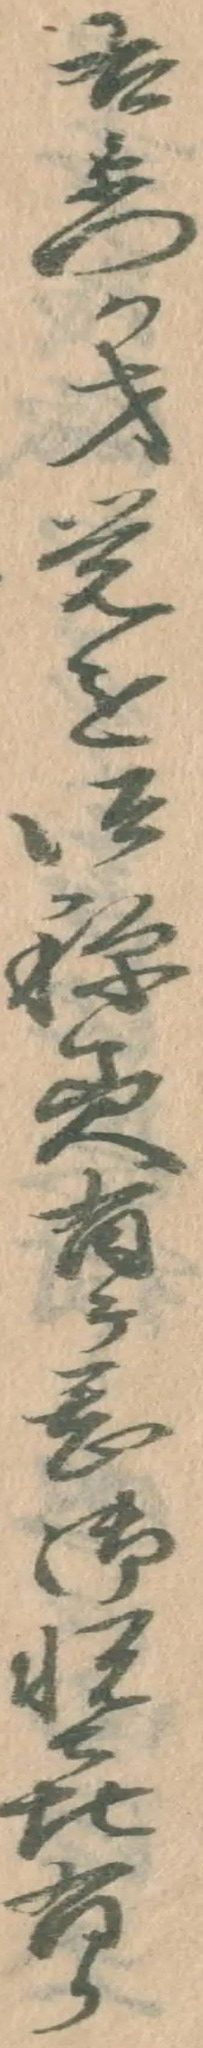右衛門か才覚を御称美有て甚御悦喜有り
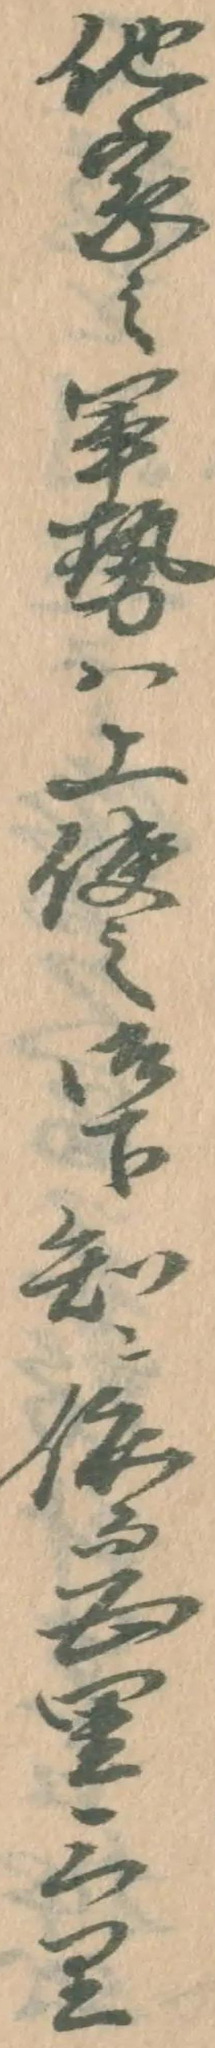他家之軍勢は上使之御下知に依而五里三里

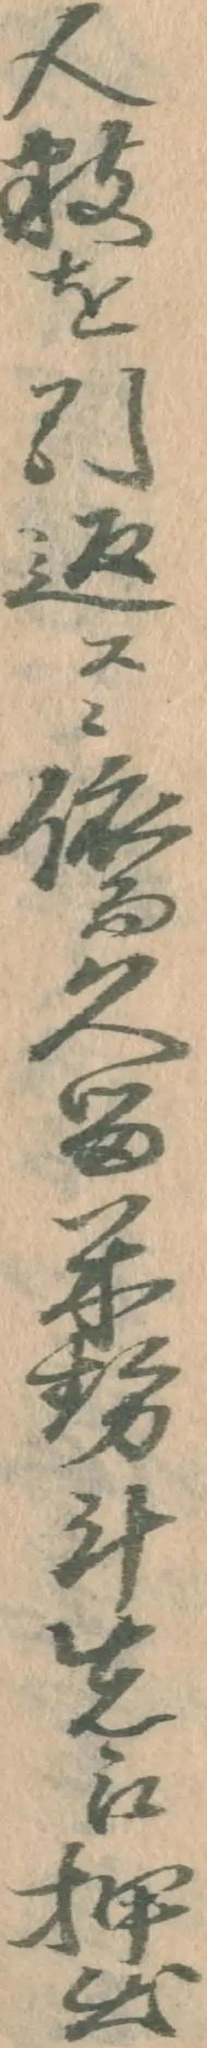人数を引返すに依而久留米勢斗先江押出
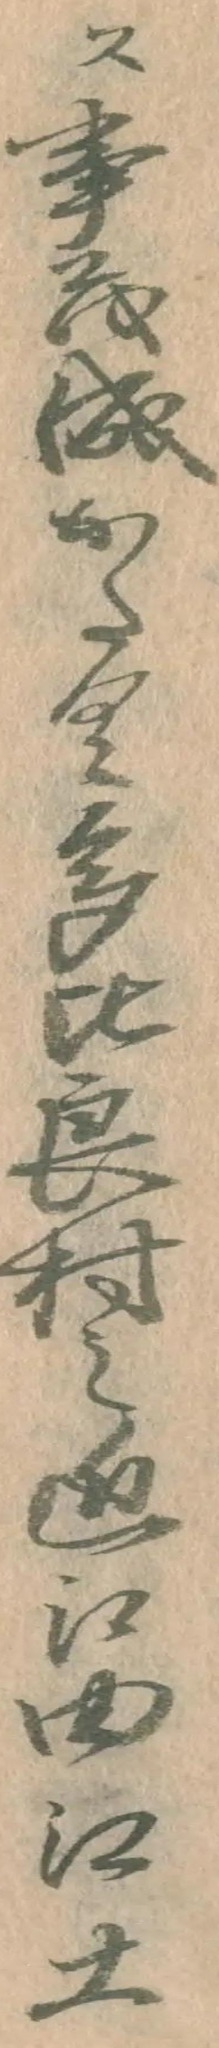す事茂成かた具多比良村之近江由江土
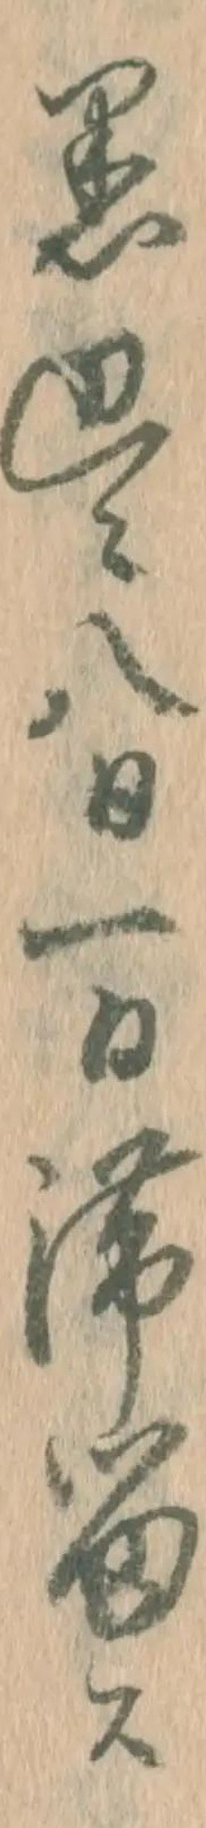黒辺に八日一日滞留す

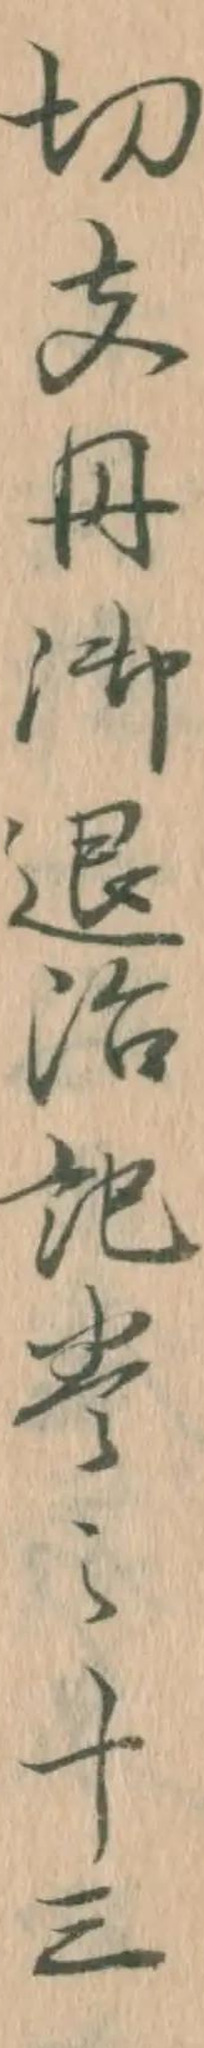切支丹御退治記巻之十三
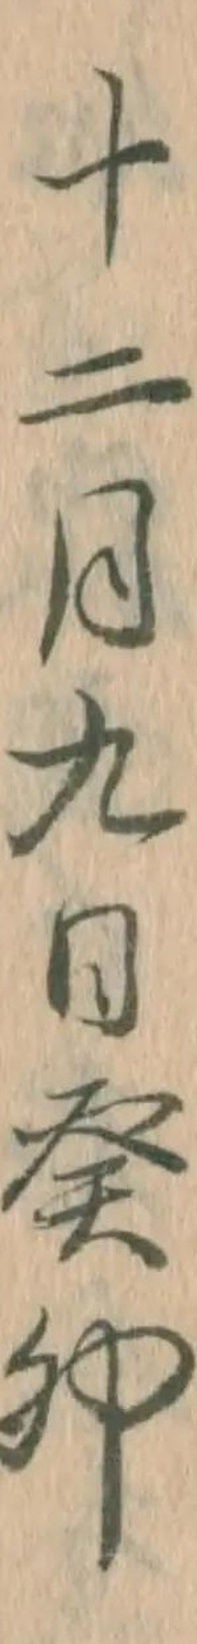十二月九日癸夘
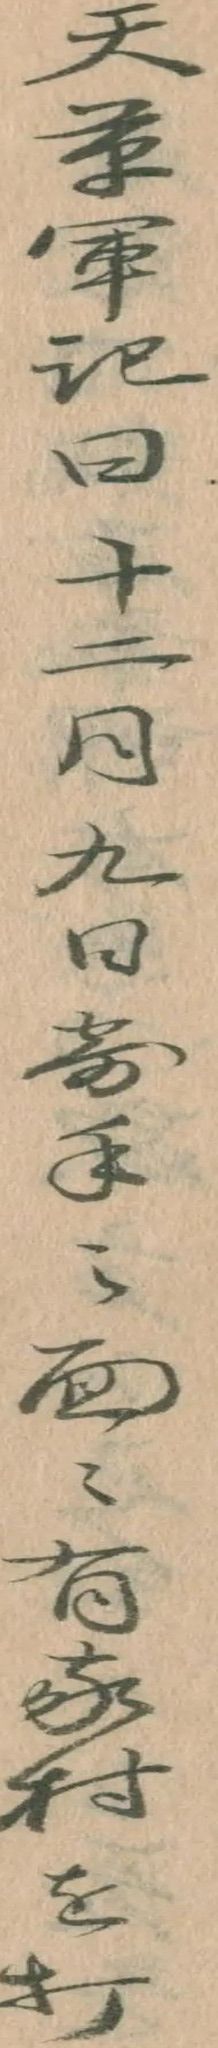天草軍記曰十二月九日寄手之面々有家村を打
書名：切支丹御退治記 49巻. [4]
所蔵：国立国会図書館 National Diet Library, JAPAN
